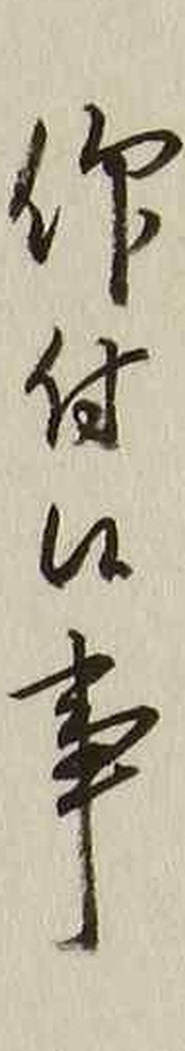仰付候事
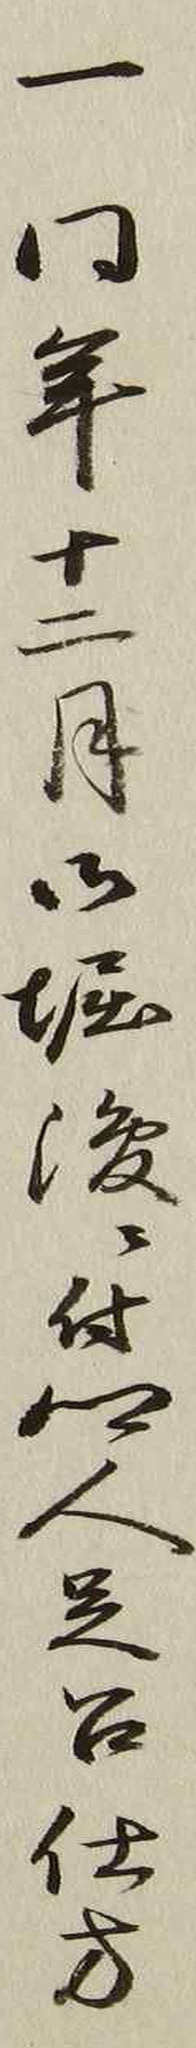一同年十二月御堀浚ニ付郷人足召仕方
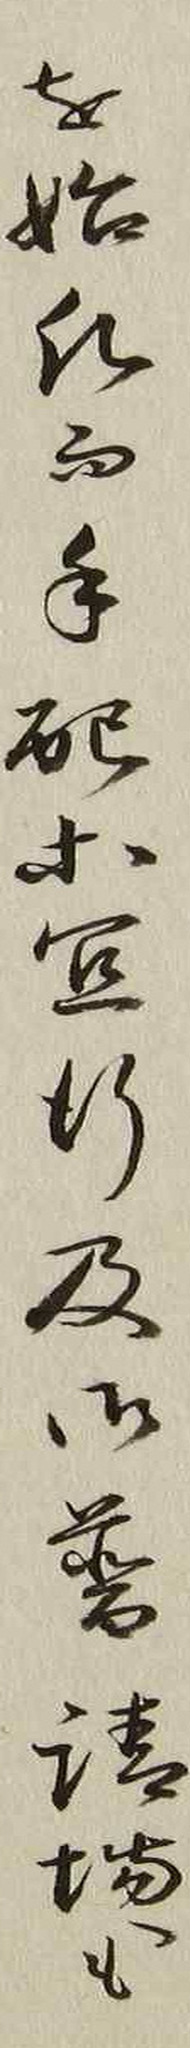を始凢而手配等宜行及御普請場ㇸも
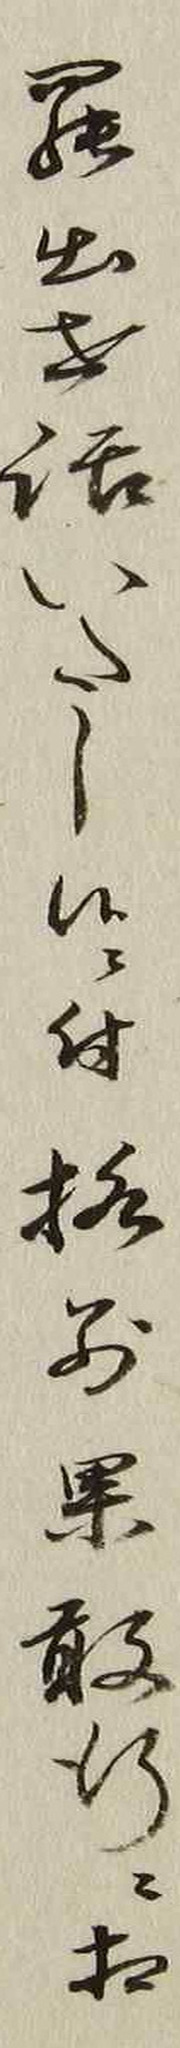罷出世話いたし候ニ付格別果敢行ニ相
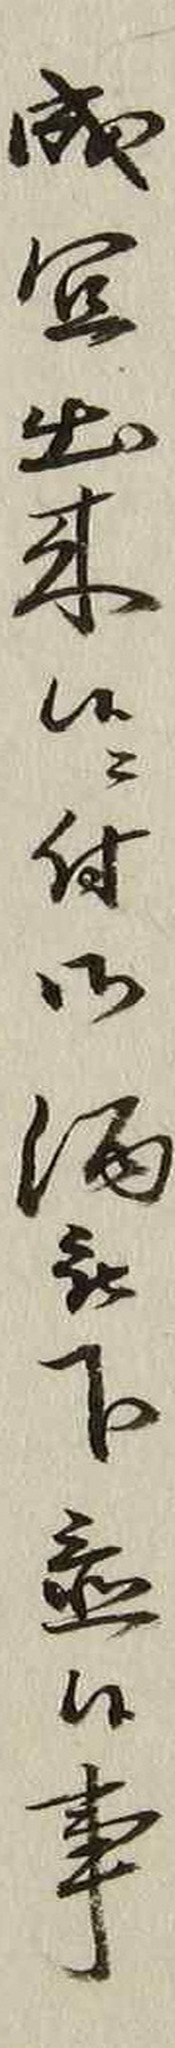成宜出来候ニ付御酒被下置候事
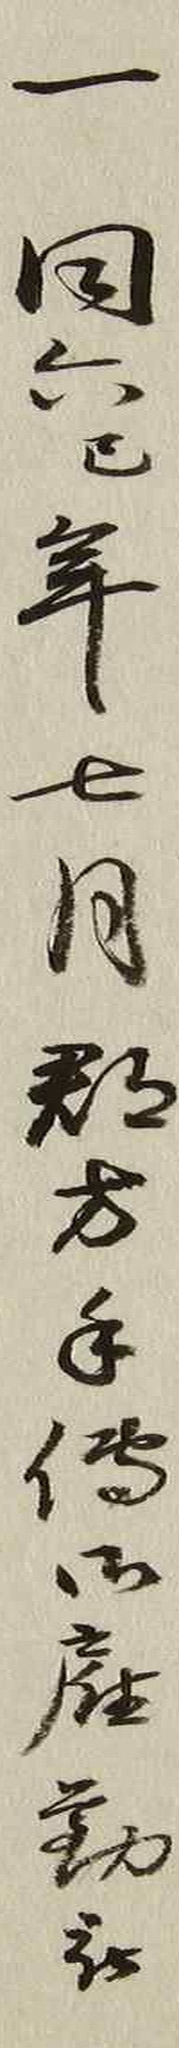一同六巳年七月郡方手伝御雇勤被
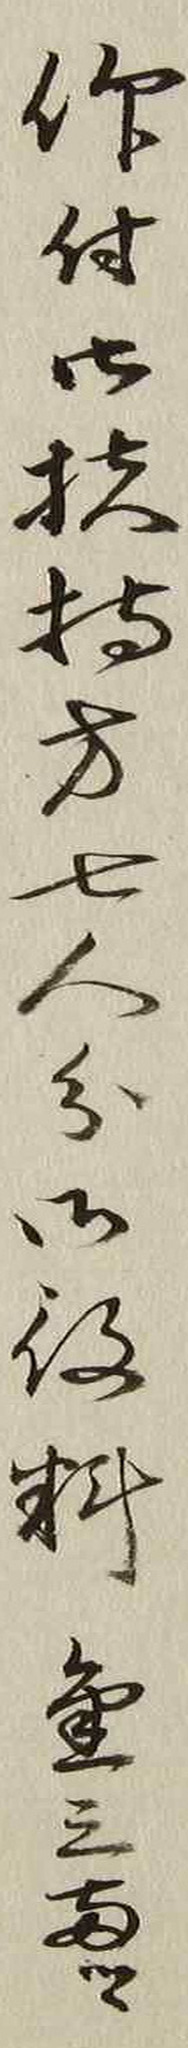仰付御扶持方七人分御役料金三両ツヽ
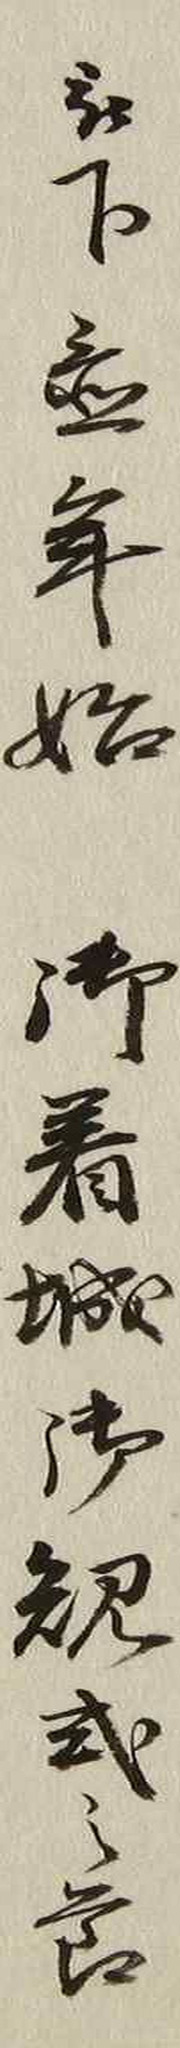被下置年始御着城御規式之節
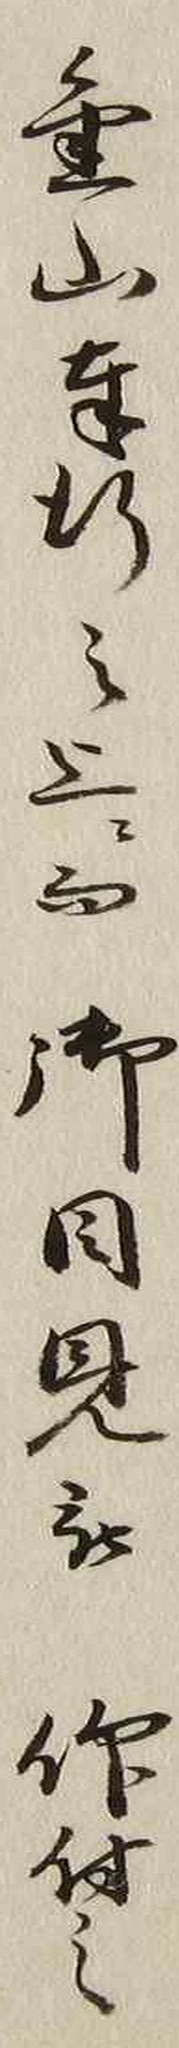金山奉行之上ニ而御目見被仰付之
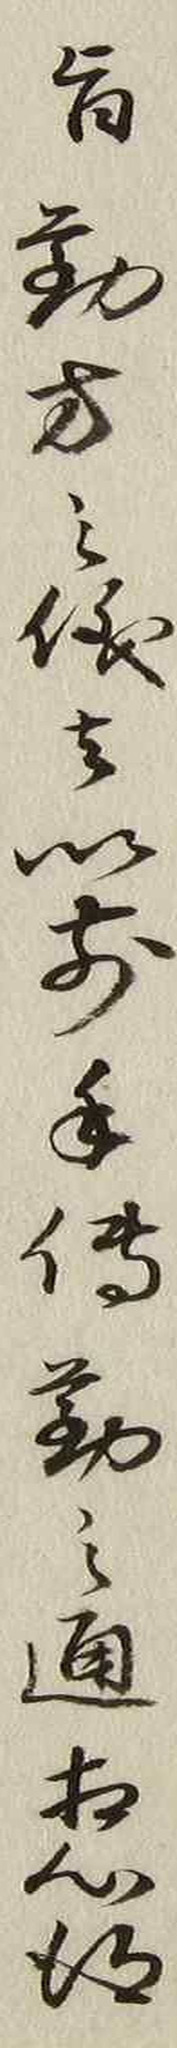旨勤方之儀は以前手伝勤之通相心得
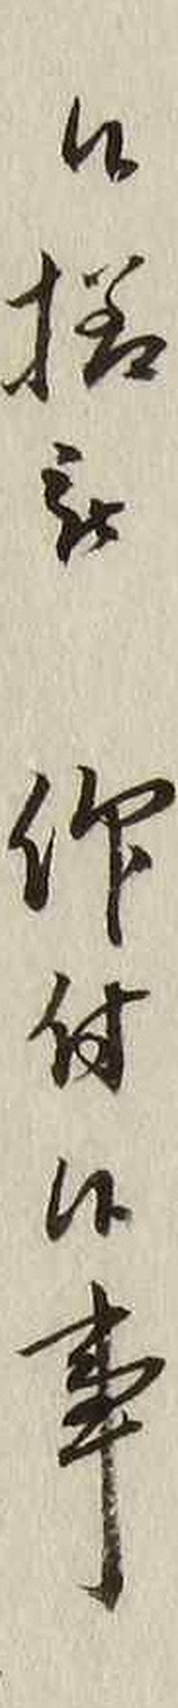候様被仰付候事
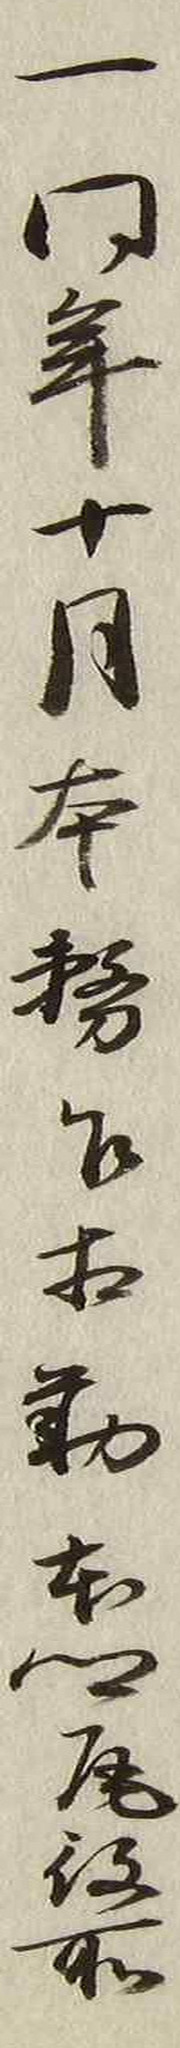一同年十月本務乍相勤本郷瓦役所
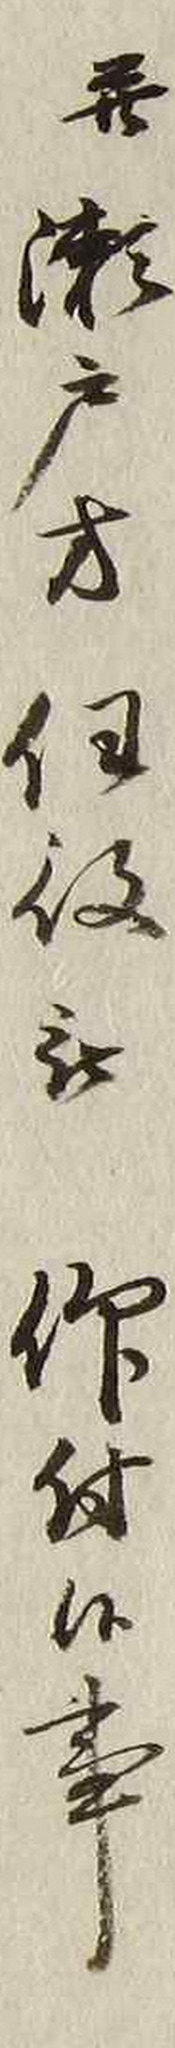并瀬戸方任役被仰付候事
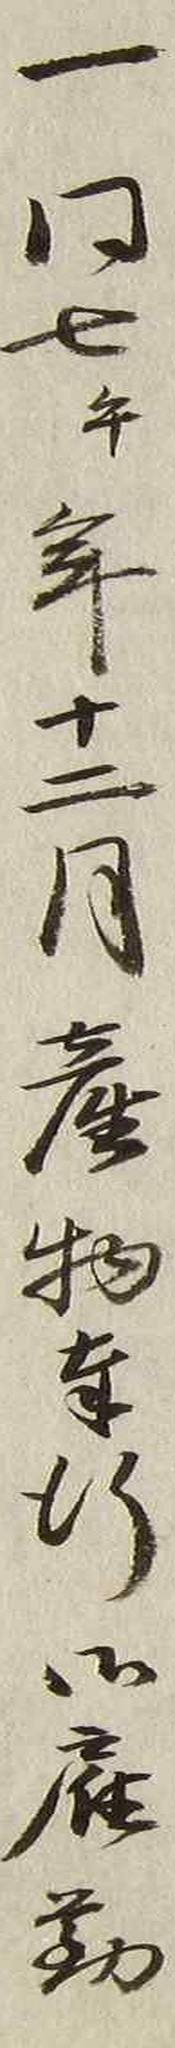一同七午年十二月産物奉行御雇勤
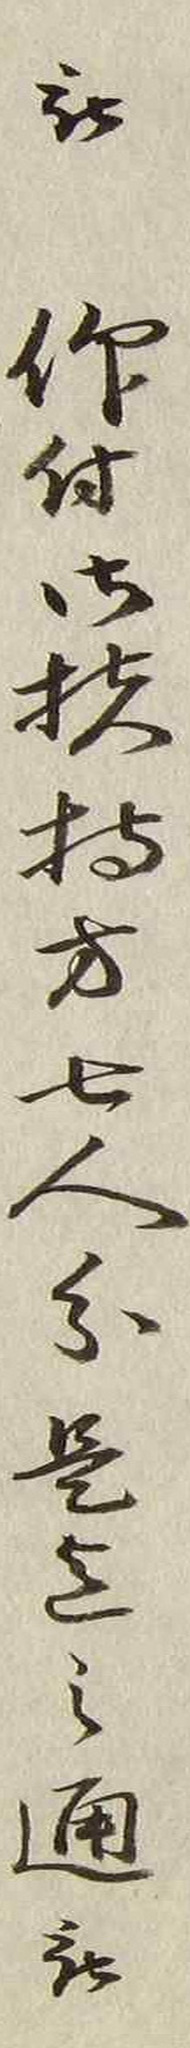被仰付御扶持方七人分是迄之通被
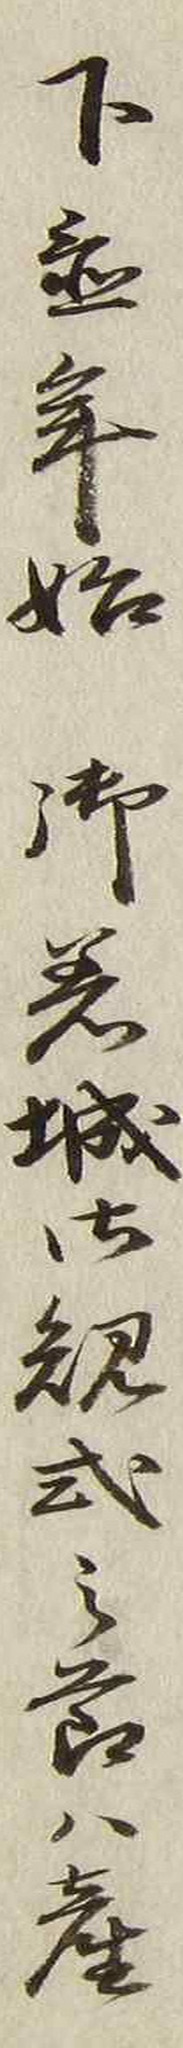下置年始御着城御規式之節は産
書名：諸士系譜　巻之160　な之部2
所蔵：会津若松市立会津図書館
